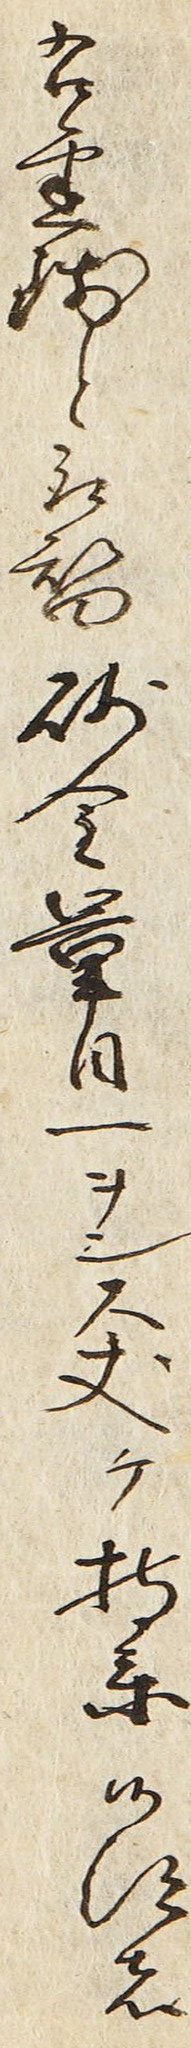右金銭と取替砂金量目一ヲンス丈ヶ持参候得は
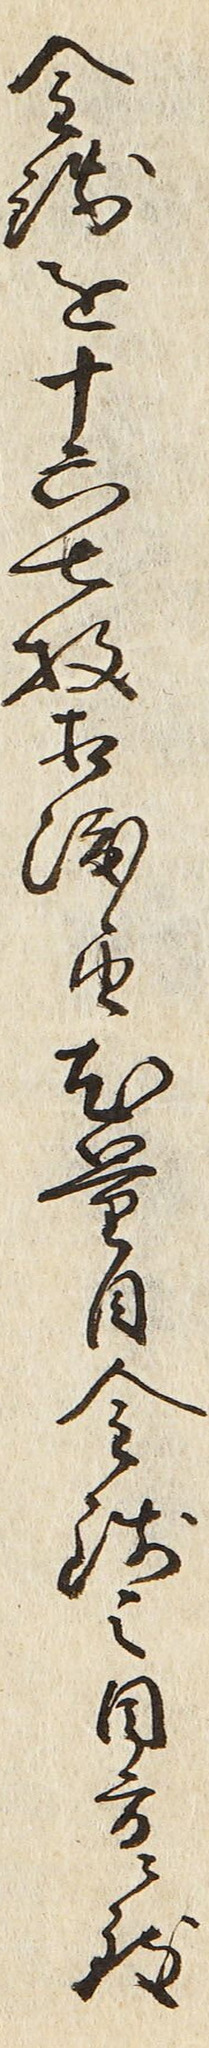金銭を十六七枚相渡候由尤量目金銭之目方に致
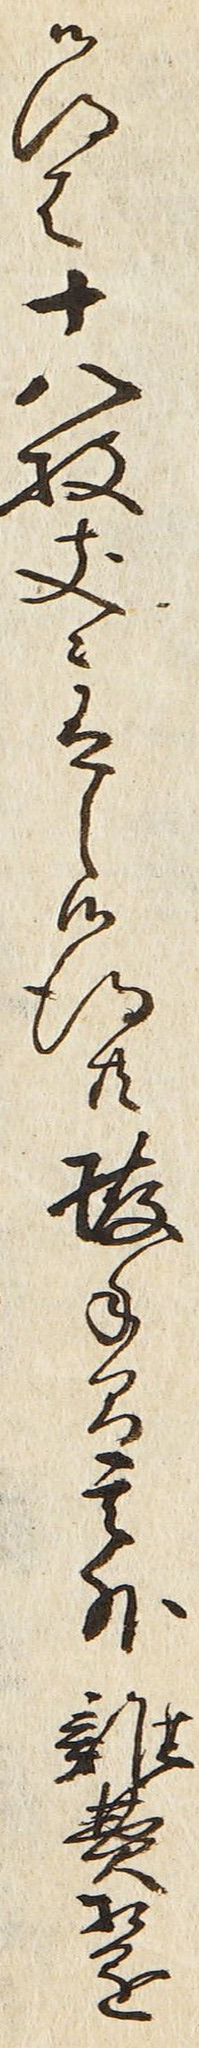候得は十八枚丈に有之候得共拵手間其外雑樋費相懸
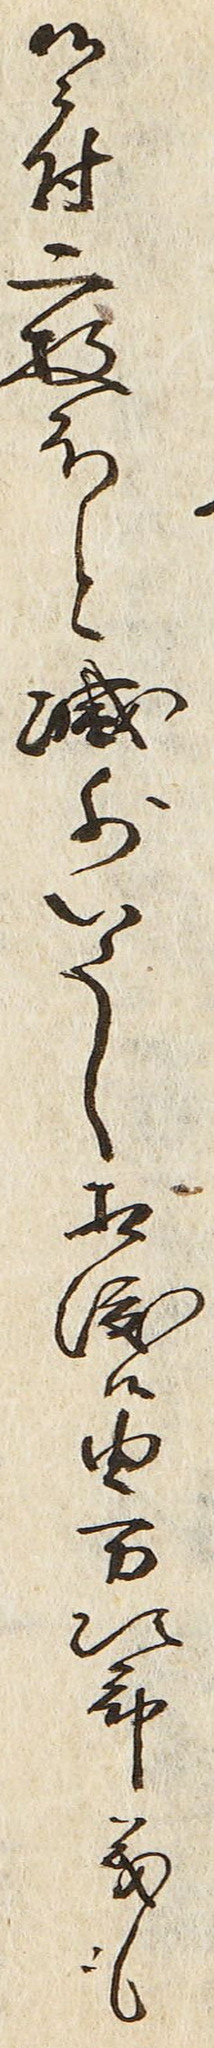候に付二枚ほと減少いたし相渡候由万次郎義も
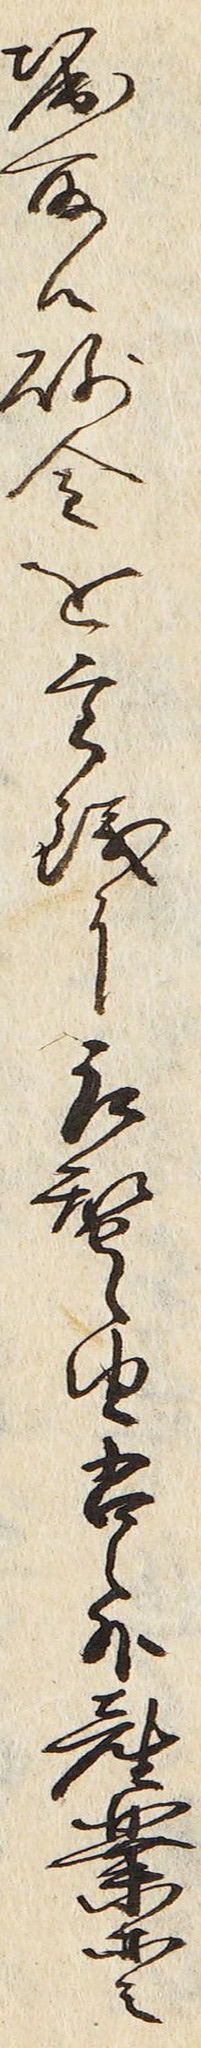掘取候砂金を金銭に取替之由右之外産業等之
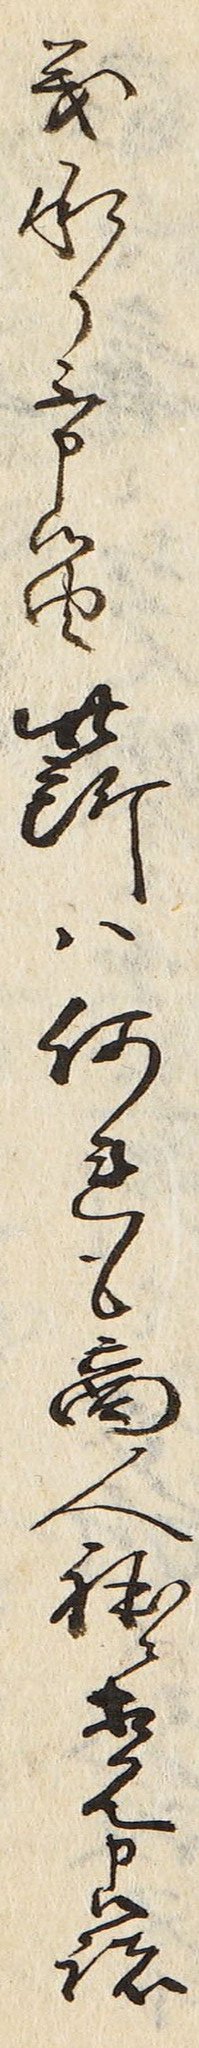義承り不申候由此所は何れも商人躰に相見申候諸
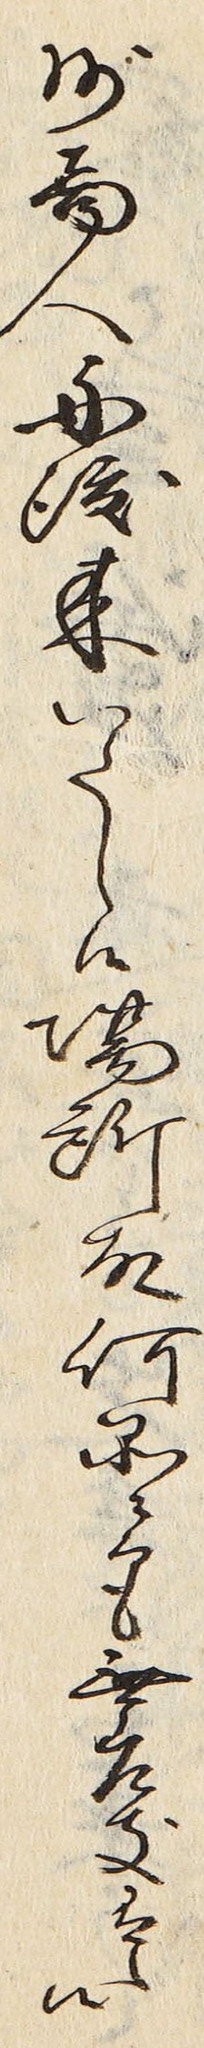州商人舟渡来いたし候場所故何品に而も無差支有之候
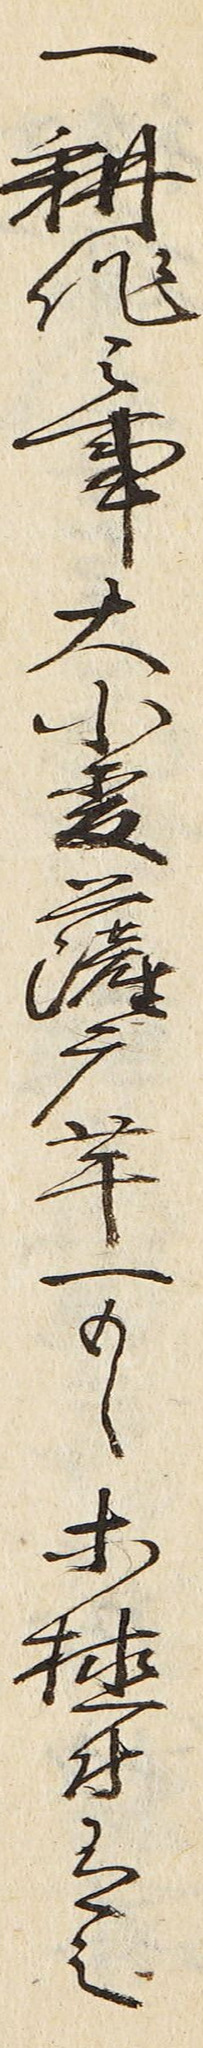一耕作之事大小麦薩摩芋一もし等植付有之
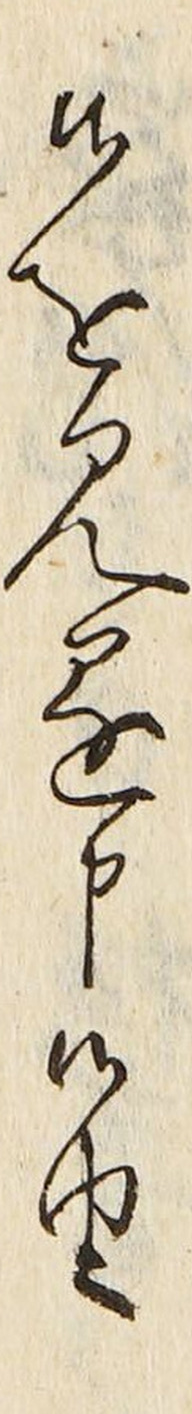候を見懸申候由
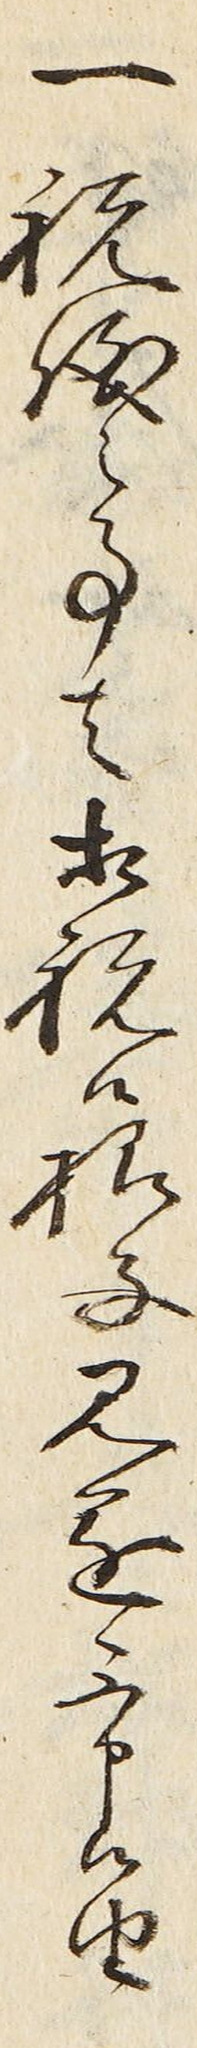一祝儀之事は相祝候様子見懸不申候由
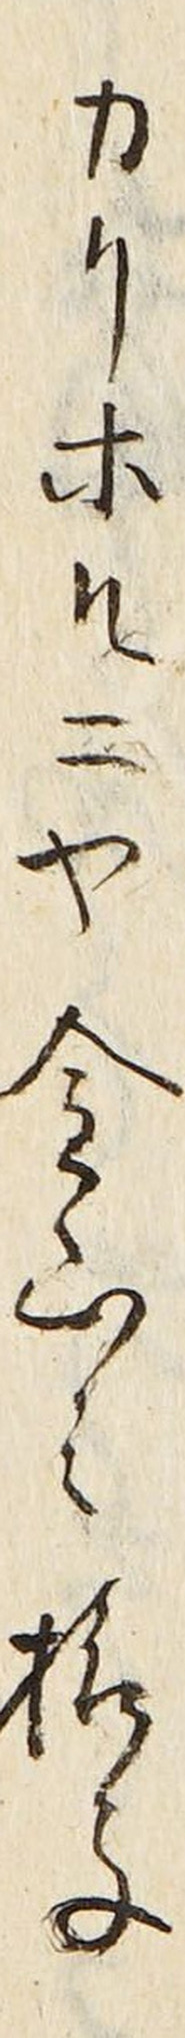カリホルニヤ金山之様子
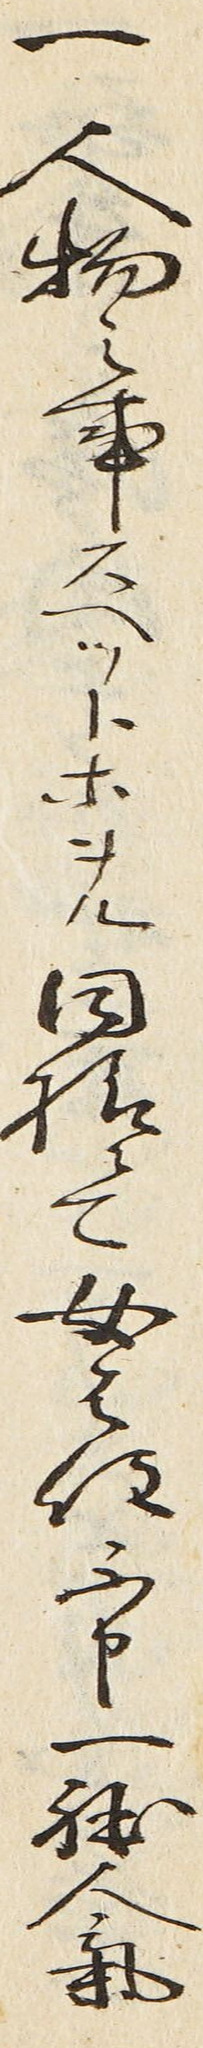一人物之事スヘツトホヲル同様にて女は住不申一躰人気
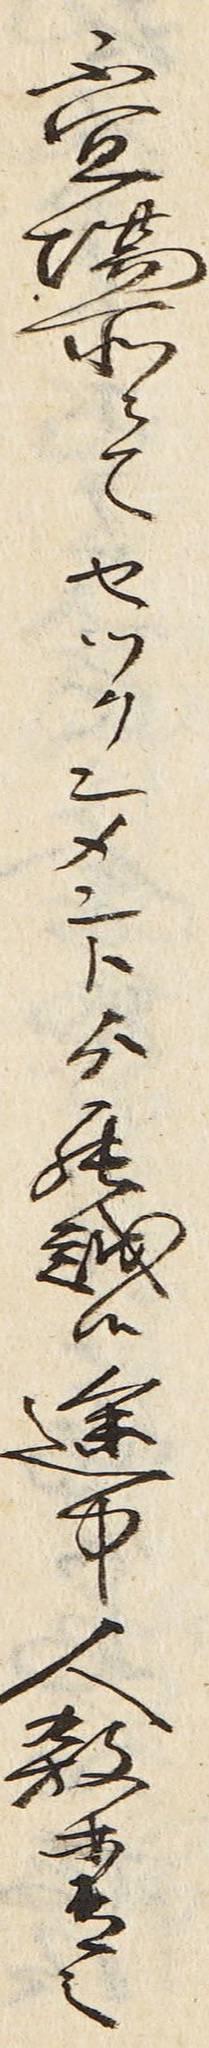不宜場所にてセツクンメントゟ罷越候途中人殺等有之
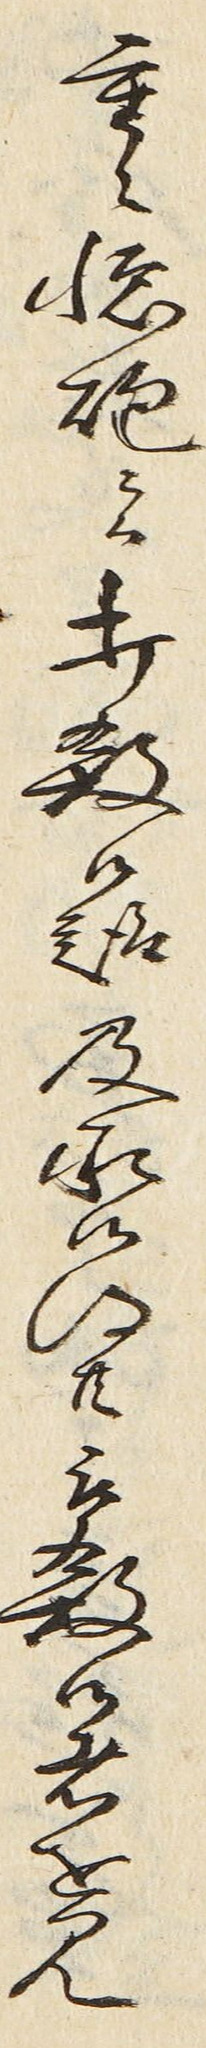重々懐砲に而打殺候趣及承候得共取殺候者を見
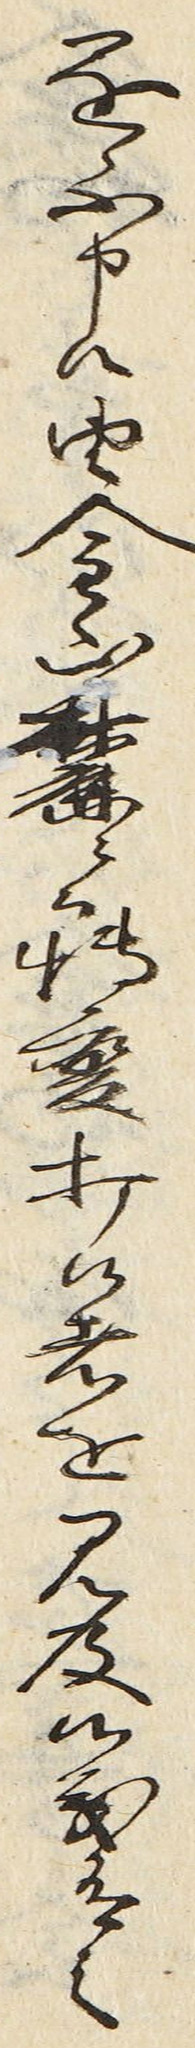懸不申候由金山麓に而博奕打候者を見及候義有之
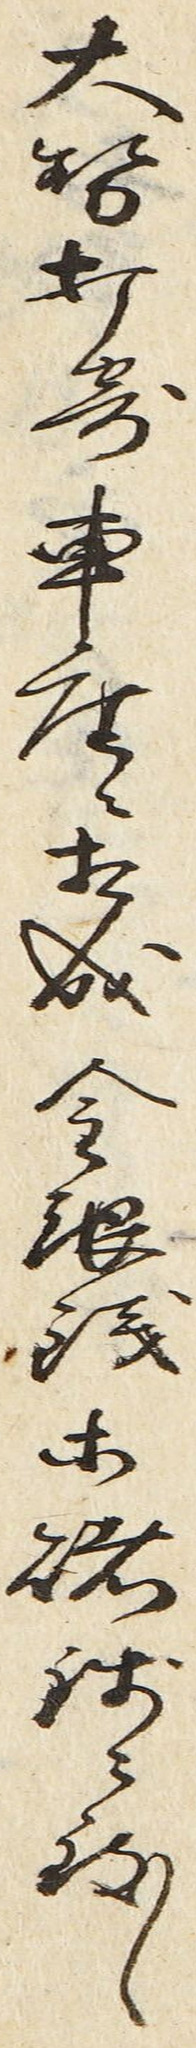大勢打寄車座に相成金銀銭等賭銭に致し
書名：土佐中浜万次郎漂流記
